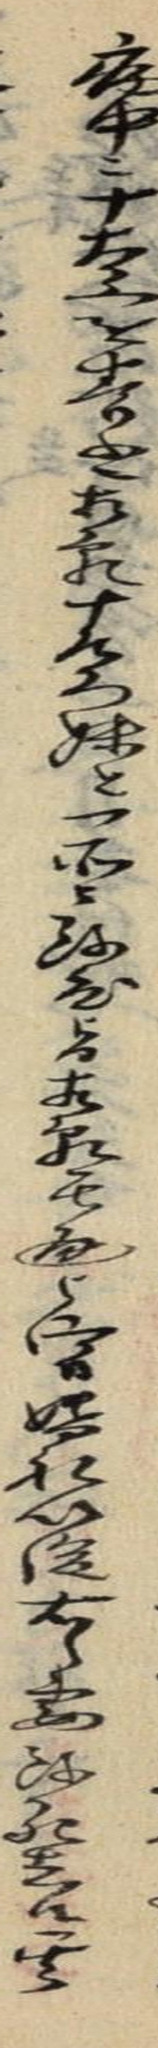病中に十太夫を養子に相願十左衛門妹と一所に致度旨相願其通被仰付婚礼以後右之妻致死去候其
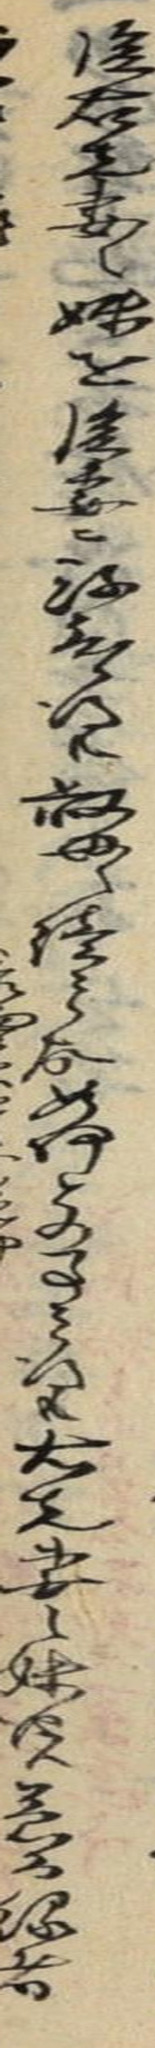後右先妻之妹を後妻に致度候得共叔母の続ニ候故如何との事に候得共右先妻之妹儀は兼而縁者
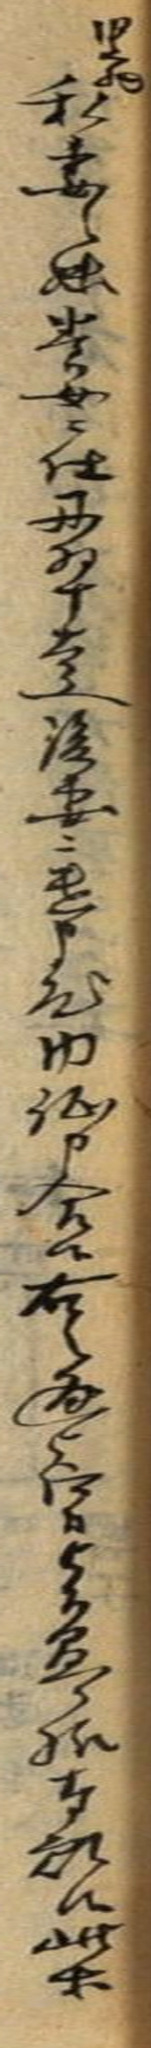私妻之妹養女に仕丹羽十太夫後妻に遣申度内証申合候右之通被仰付被下置候様奉願候此等
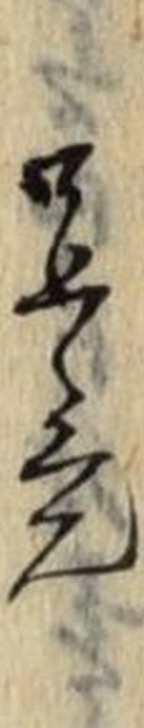口上之覚
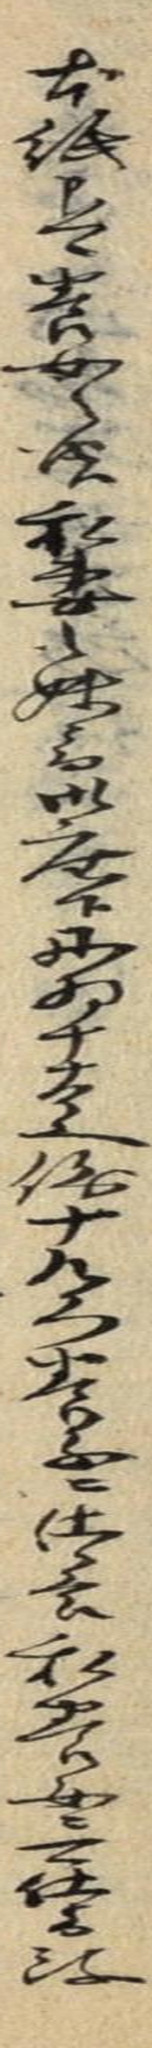本紙申上候養女之儀は私妻之妹に而御座候丹羽十太夫儀十左衛門養子に仕候節私養女に可仕旨致
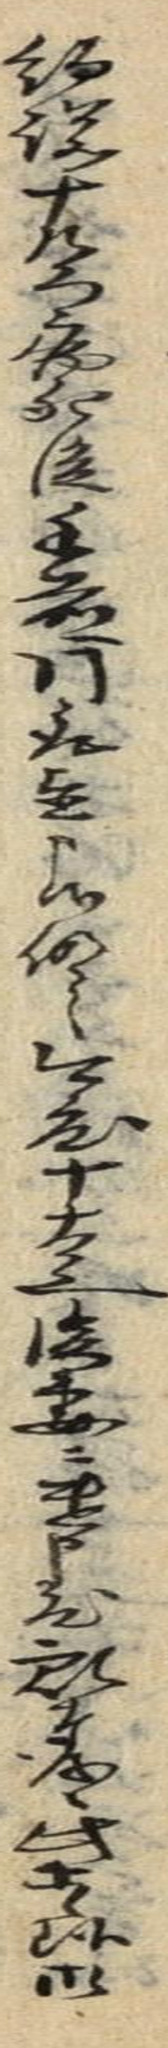約諾十左衛門病死後手前へ引取置申候仍之今度十太夫後妻に遣申度願奉存候此等之趣御
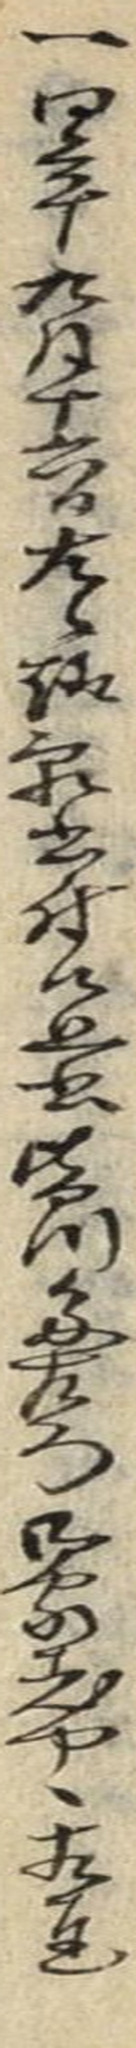一同年九月十六日左之趣願書付口上書皆川多左衛門御家老中へ相達
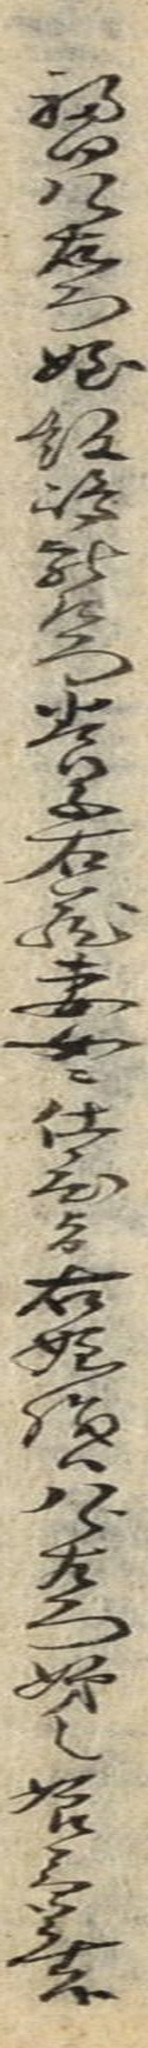福田八郎左衛門姪飯嶋新左衛門養子右蔵妻女に仕度旨右姪儀は八郎左衛門之姉之娘に而御座候
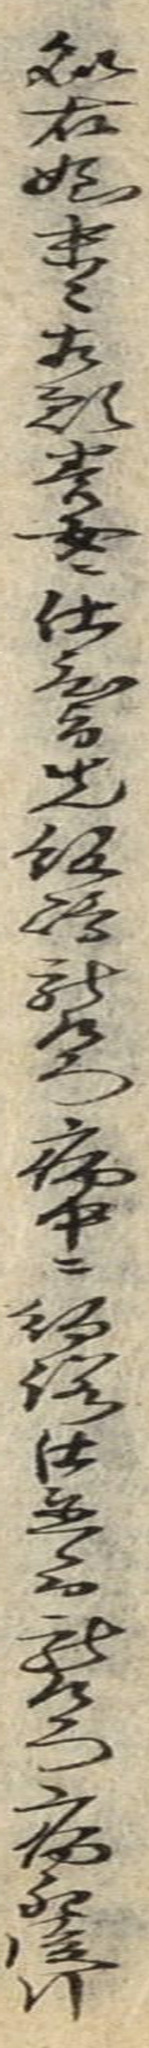処右姪末々相願養女に仕度旨先飯嶋新左衛門病中に約諾仕置候而新左衛門病死後引
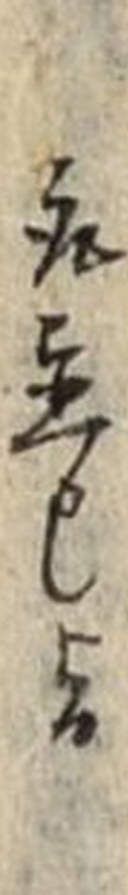取置申候旨
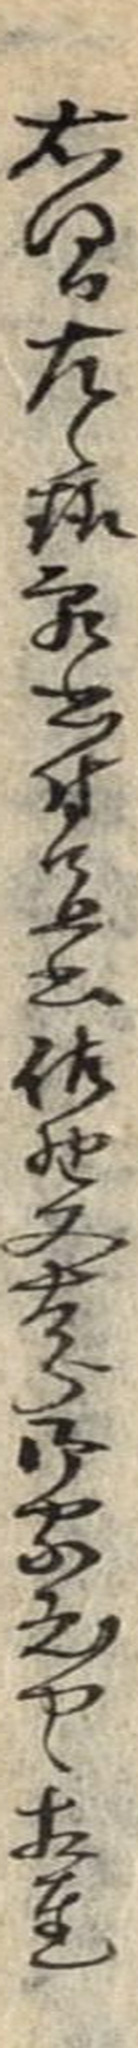右同日左之趣願書付口上書佐野又太郎御家老中へ相達
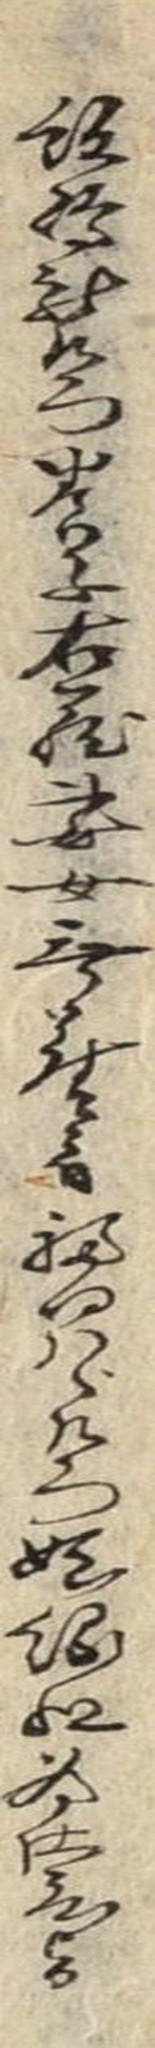飯嶋新左衛門養子右蔵妻女無御座候に付福田八郎左衛門姪縁組為仕度旨
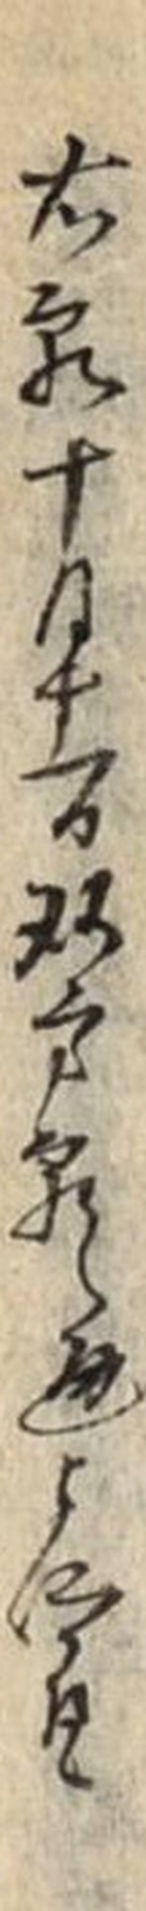右願十月十一日双方願之通被仰付候
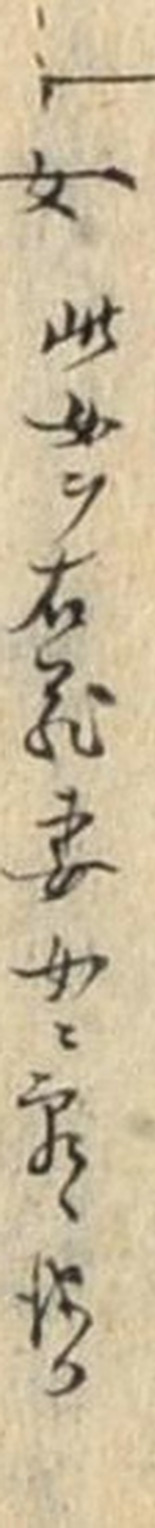妻女此女を右蔵妻女に願候儀か
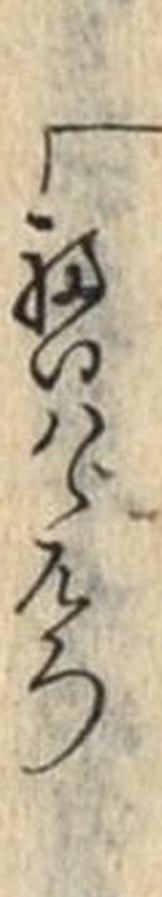福田八郎左衛門

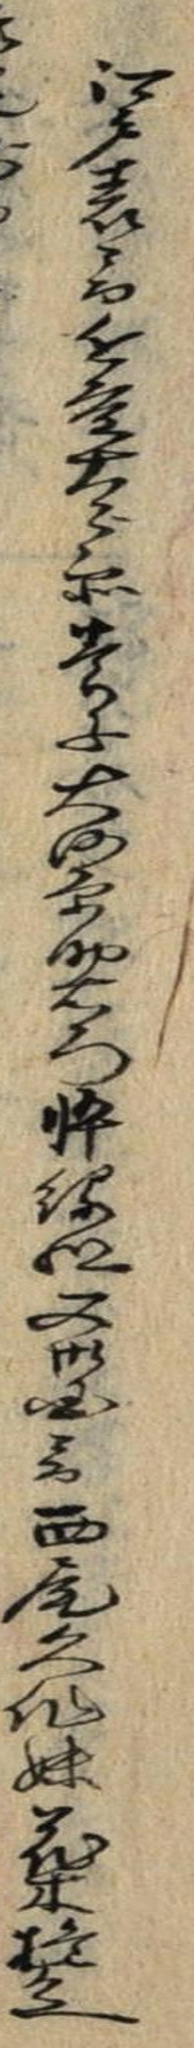一江戸表に而近藤太郎兵衛養子大河原助右衛門悴縁組又御国に而西尾久作妹花木権太夫
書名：養子縁組之部
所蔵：福井県文書館 Fukui Prefectural Archives
